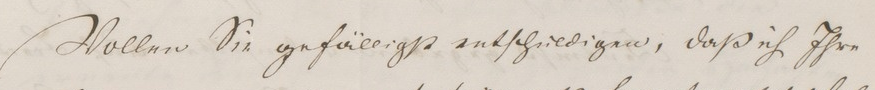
Wollen Sie gefälligst entschuldigen, daß ich Ihre
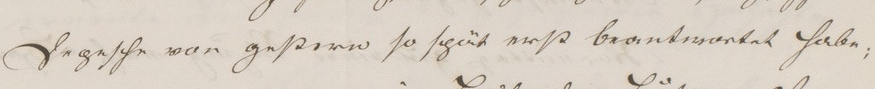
Depesche von gestern so spät erst beantwortet habe;
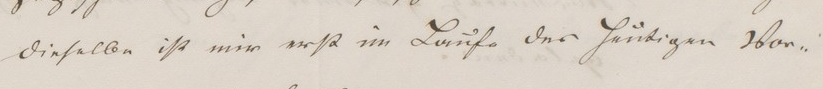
diselbe ist mir erst im Laufe des heutigen Vor-
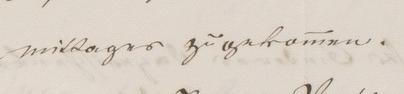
mittages zugekommen.
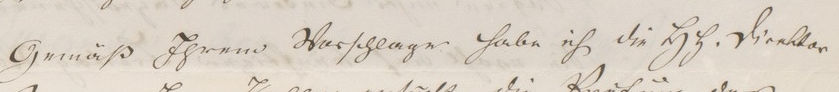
Gemäß Ihrem Vorschlage habe ich die HH. Direktor
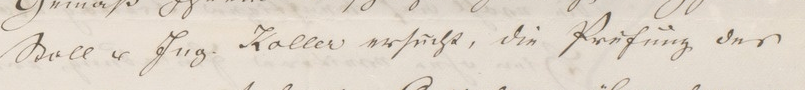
Stoll & Ing. Koller ersucht, die Prüfung des
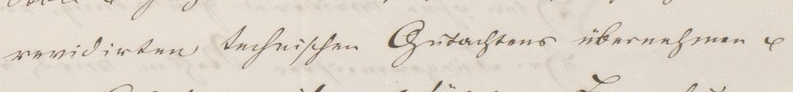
revidirten technischen Gutachtens übernehmen &
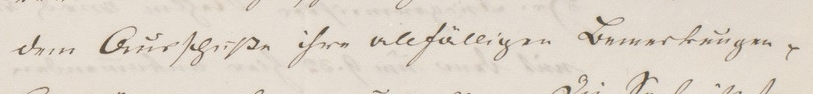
dem Ausschuße ihre allfälligen Bemerkungen &
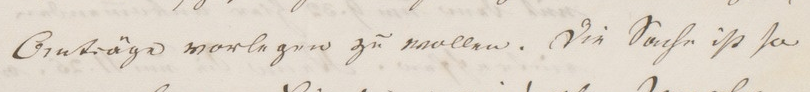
Anträge vorlegen zu wollen. Die Sache ist so
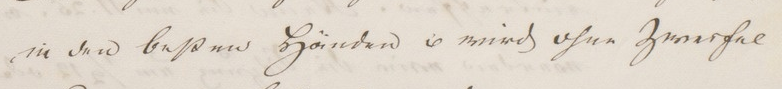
in den besten Händen & wird ohne Zweifel
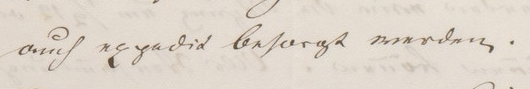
auch expedit besorgt werden.
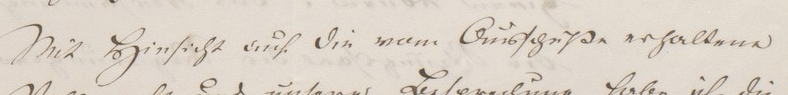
Mit Einsicht auf die vom Ausschuße erhaltene
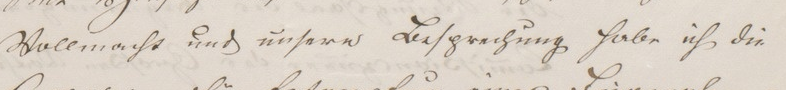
Vollmacht und unsere Besprechung habe ich die
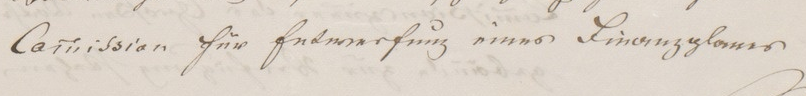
Commission für Entwerfung eines Finanzplanes
